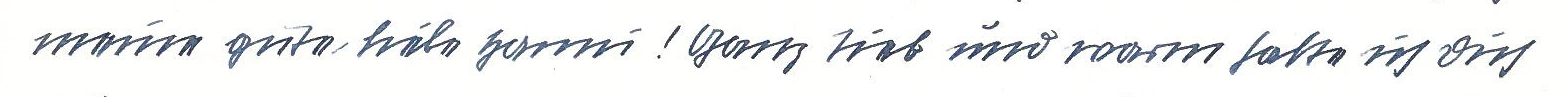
meine gute, liebe Hilde! Ganz lieb und warm hatte ich Dich
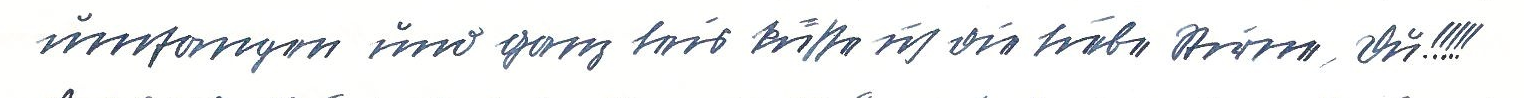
umfangen und ganz leis küsse ich die liebe Stirne, Du!!!!!
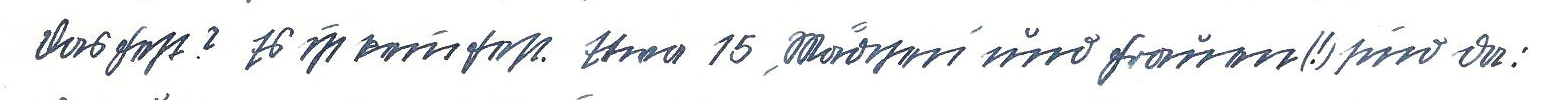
Das Fest? Es ist kein Fest. Etwa 15 Mädchen und Frauen (!) sind da:
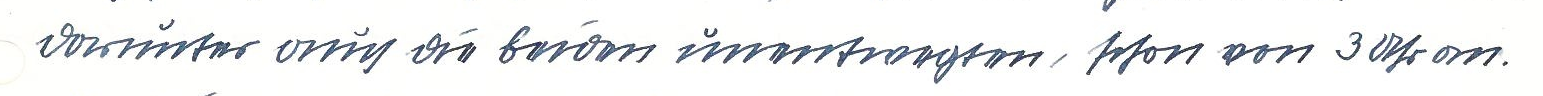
darunter auch die beiden unentwegten, schon von 3 Uhr an.
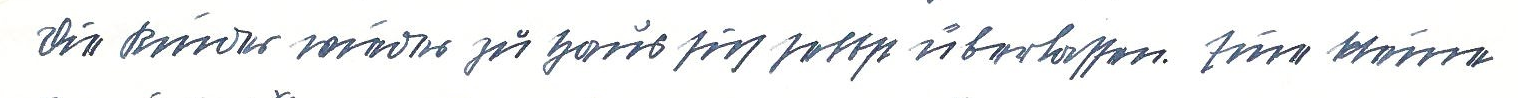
Die Kinder wieder zu Haus sich selbst überlassen. Eine kleine
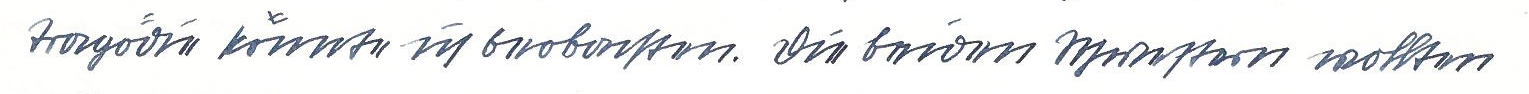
Tragödie konnte ich beobachten. Die beiden Schwestern wollten
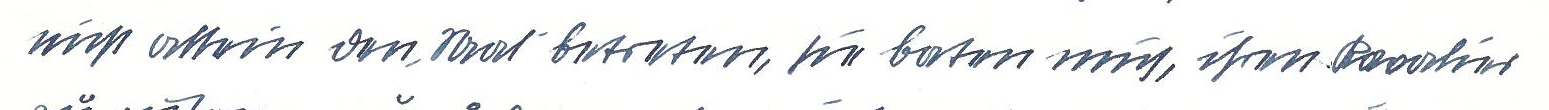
nicht allein den Saal betreten, sie baten mich, ihren Kavalier
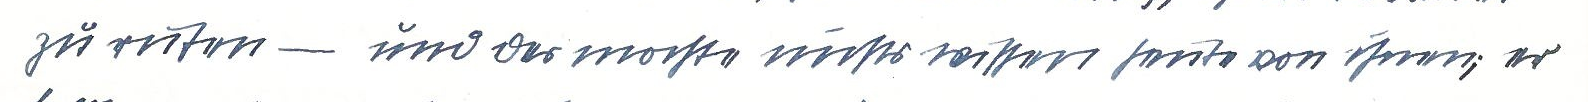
zu rufen – und der mochte nichts wissen heute von ihnen; er
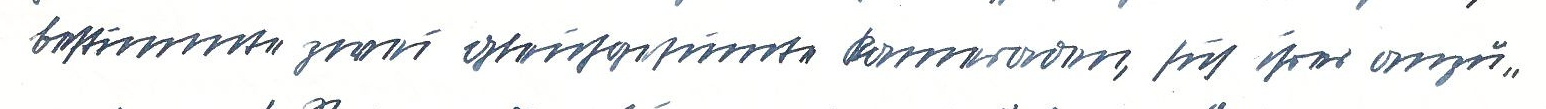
bestimmte zwei gleichgesinnte Kameraden, sich ihrer anzu¬
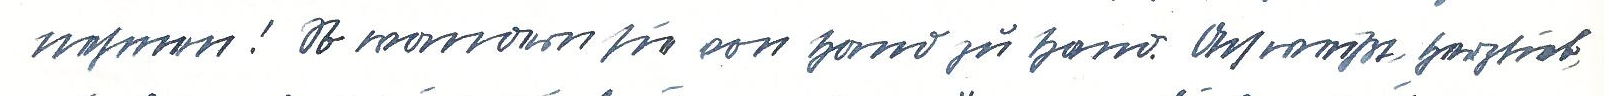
nehmen! So wandern sie von Hand zu Hand. Ach weißt, Herzlieb,
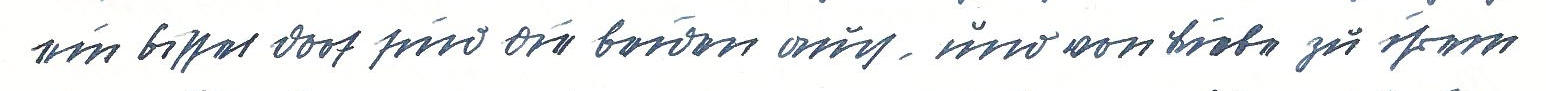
ein bissl doof sind die beiden auch, und von Liebe zu ihrem
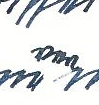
ver
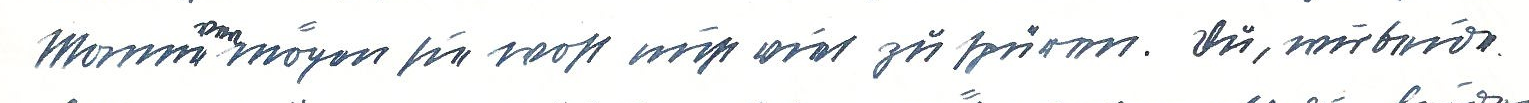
Mann mögen sie wohl nicht viel zu spüren. Du, wir beiden
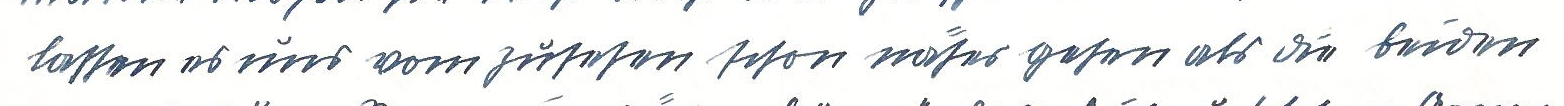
lassen uns vom Zusehen schon näher gehen als die beiden
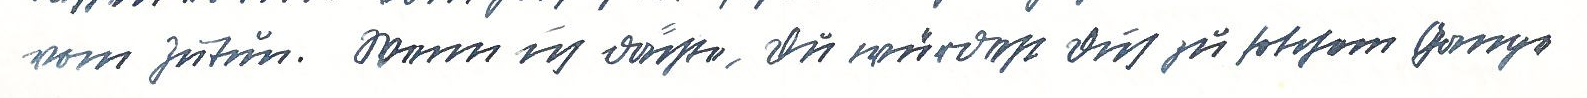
vom Zutun. Wenn ich dächte, Du würdest dich zu solchem Gange
